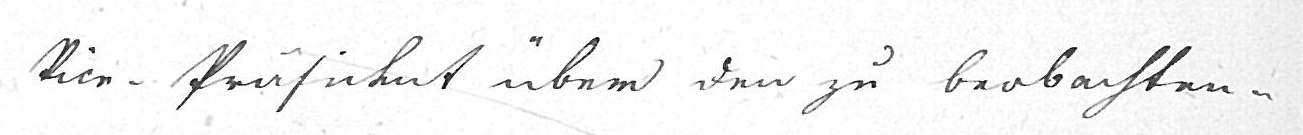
Vice-Präsident über den zu beobachten-
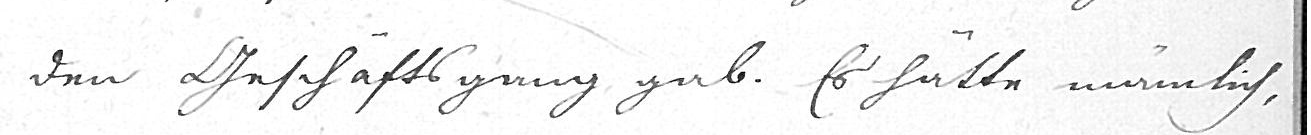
den Geschäftsgang gab. Es hätte nämlich,
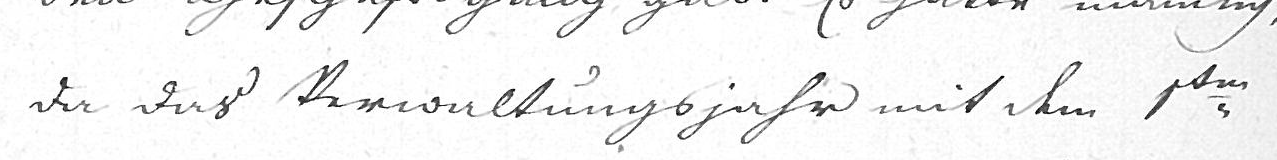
da das Verwaltungsjahr mit dem 1ten
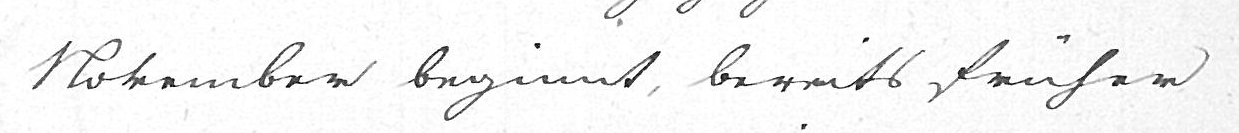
November beginnt, bereits früher,
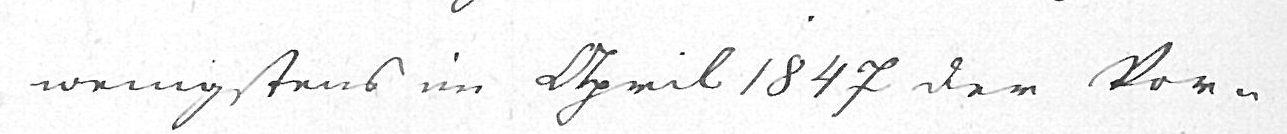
wenigstens im April 1847 der Vor-
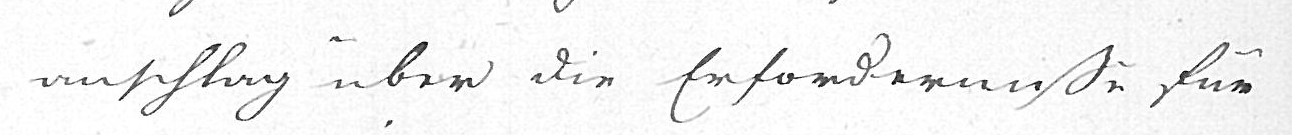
anschlag über die Erfordernisse für
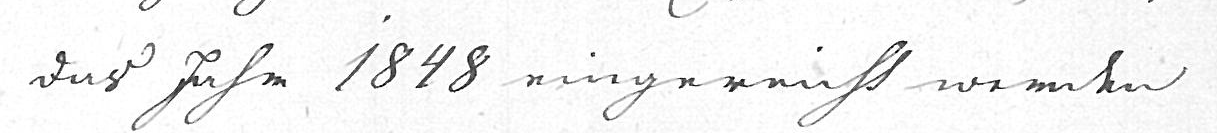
das Jahr 1848 eingereicht werden
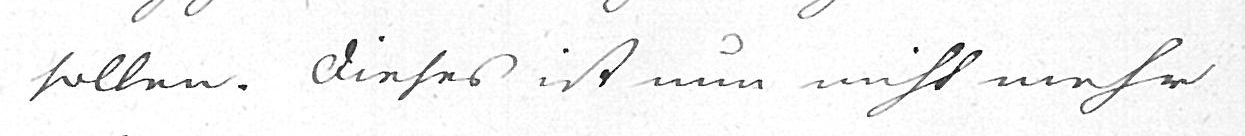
sollen. Dieses ist nun nicht mehr
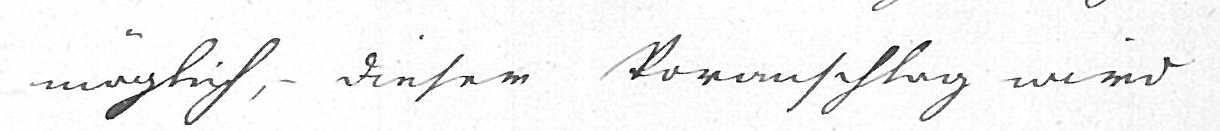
möglich, dieser Voranschlag wird
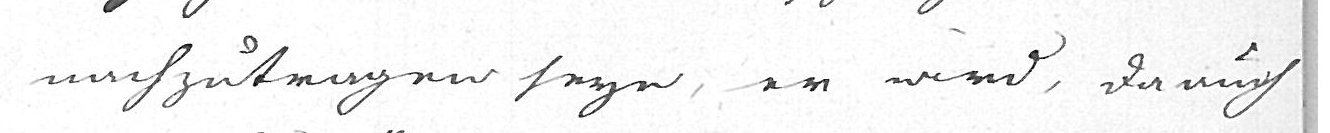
nachzutragen seyn, er wird, da auch
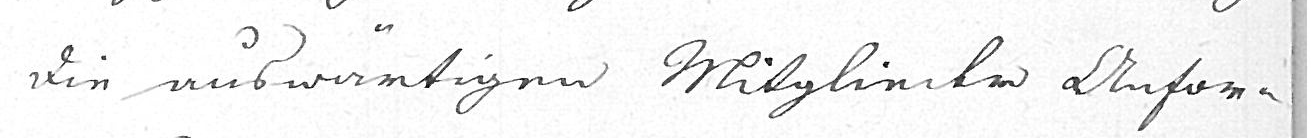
die auswärtigen Mitglieder Anfor-
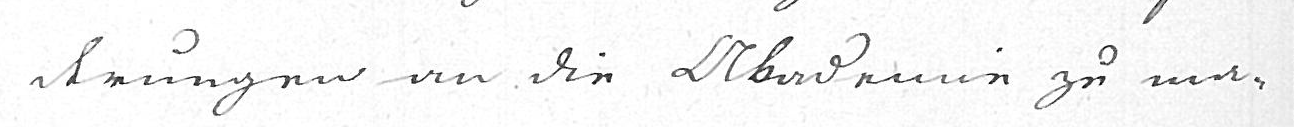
derungen an die Akademie zu ma-
